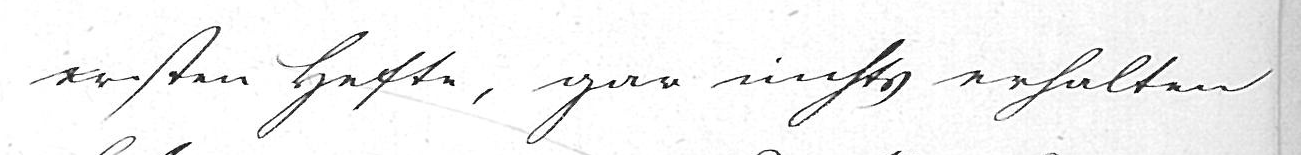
ersten Hefte, gar nichts erhalten
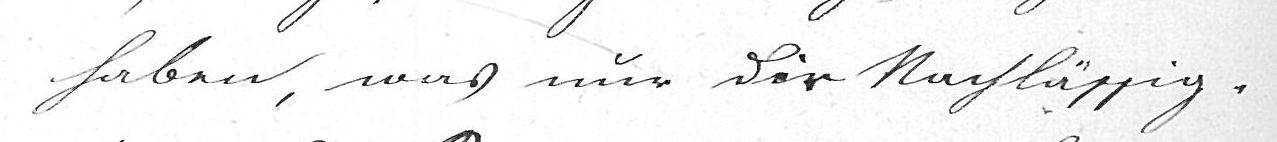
haben, was nur der Nachlässig-
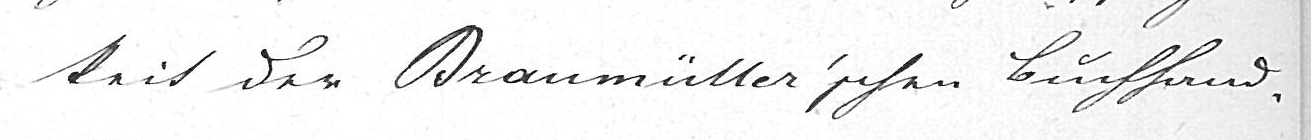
keit der Braumüller'schen Buchhand-
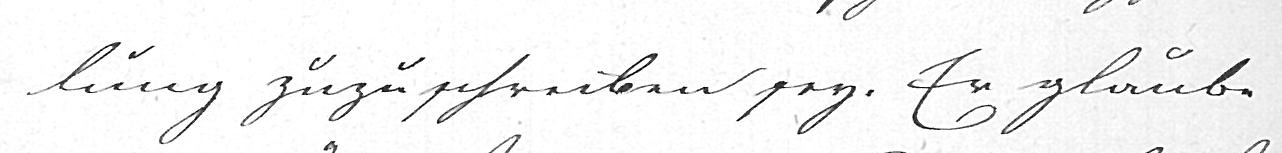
lung zuzuschreiben sey. Er glaube
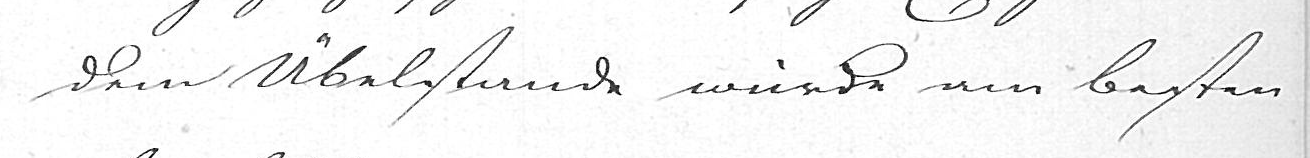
den Übelstande würde am besser
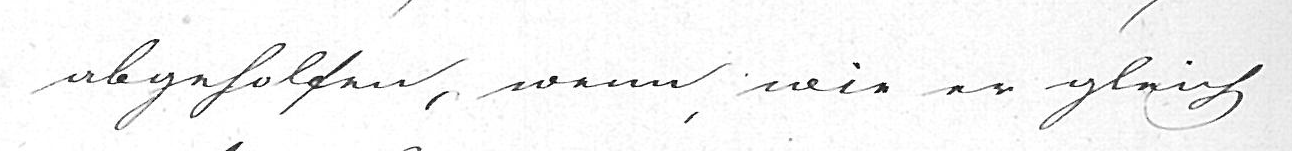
abgeholfen, wenn wie er gleich
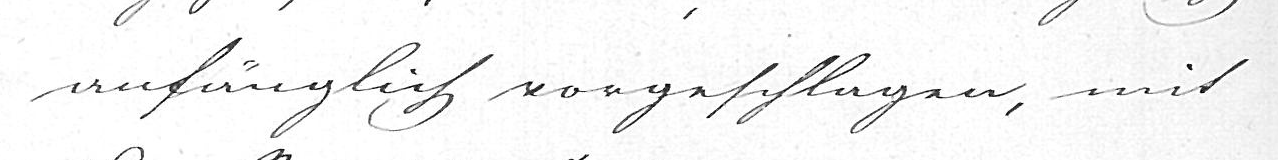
anfänglich vorgeschlagen, mit
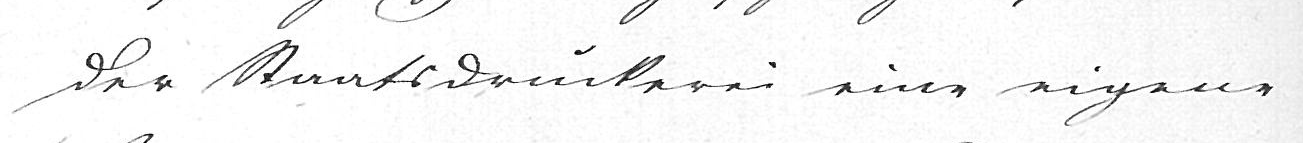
der Staatsdruckerei eine eigene
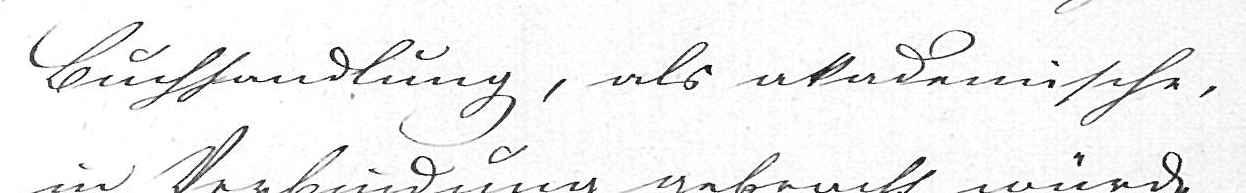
Buchhandlung, als akademische,
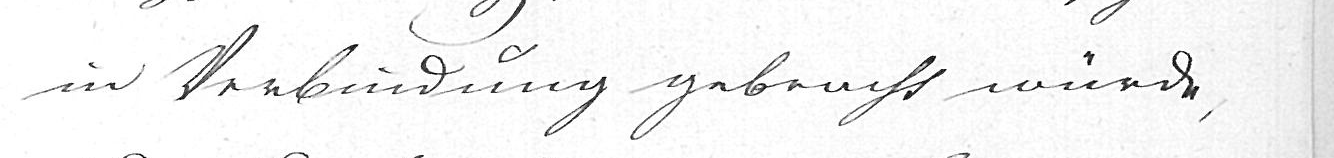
im Verbindung gebracht würde,
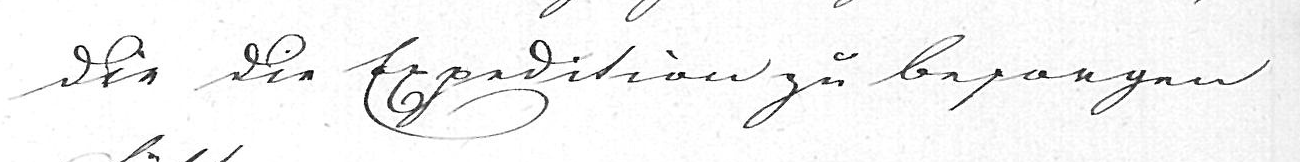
die die Expedition zu besorgen
